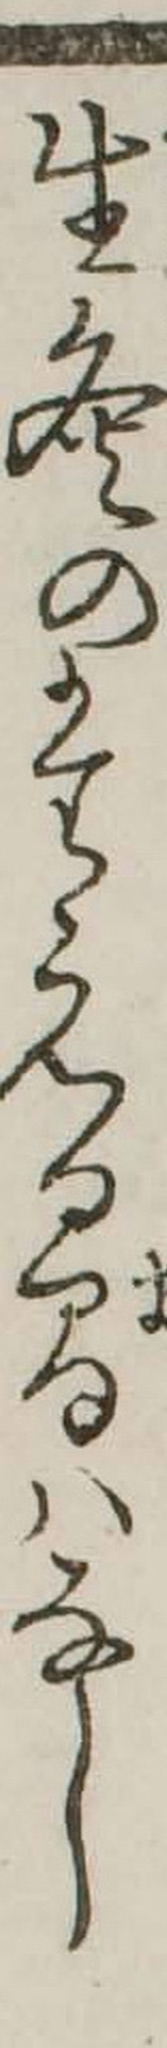生灸のたえる間はなし
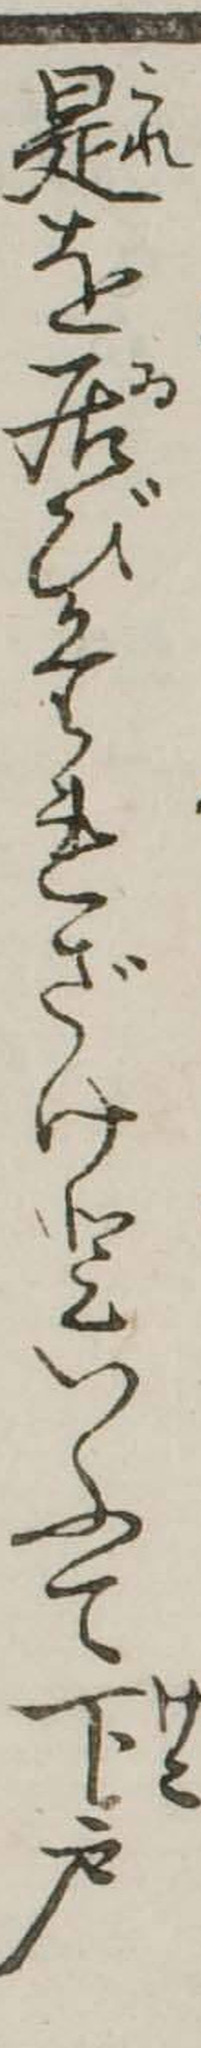是を居びたれざけといふて下戸
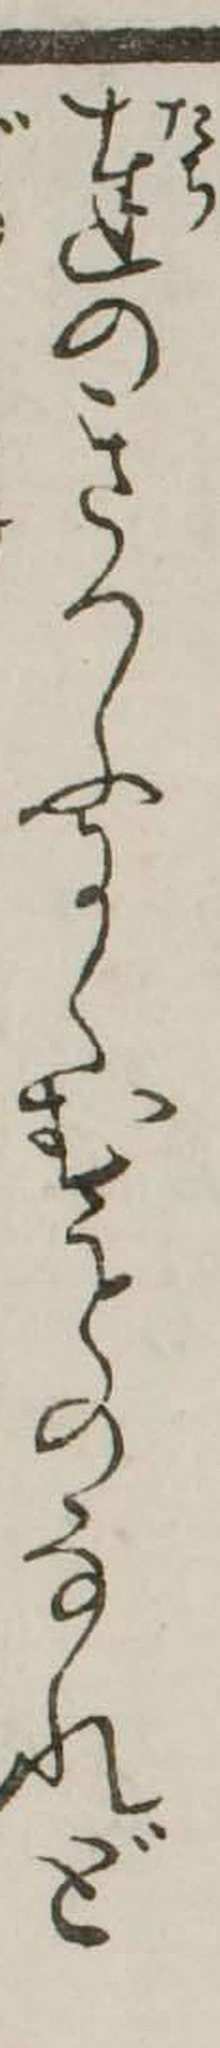達のきつふにくむものなれど
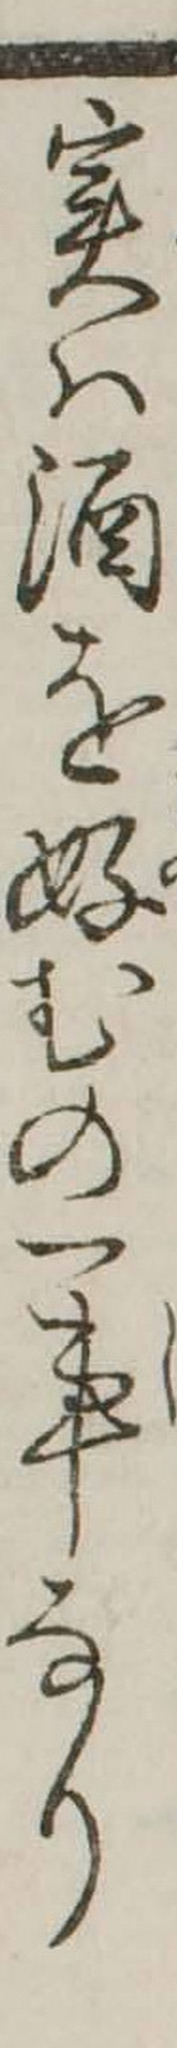実は酒を好むの一事なり
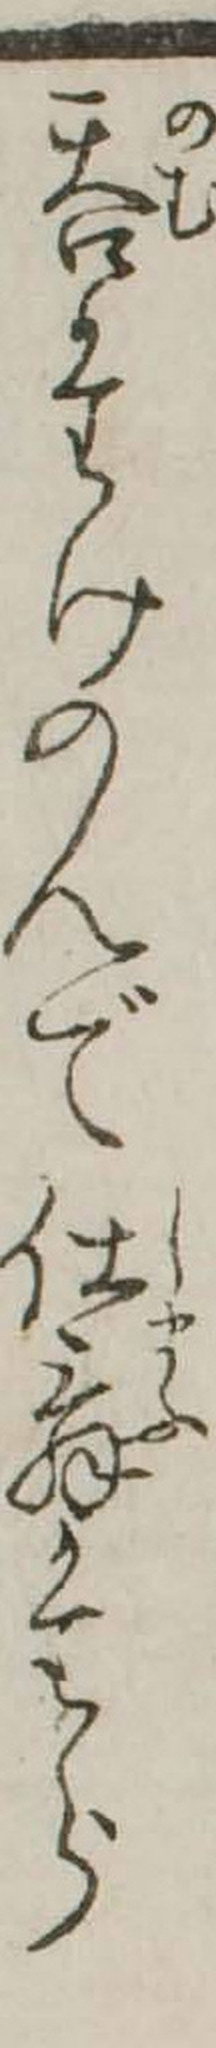呑たけのんで仕舞たら
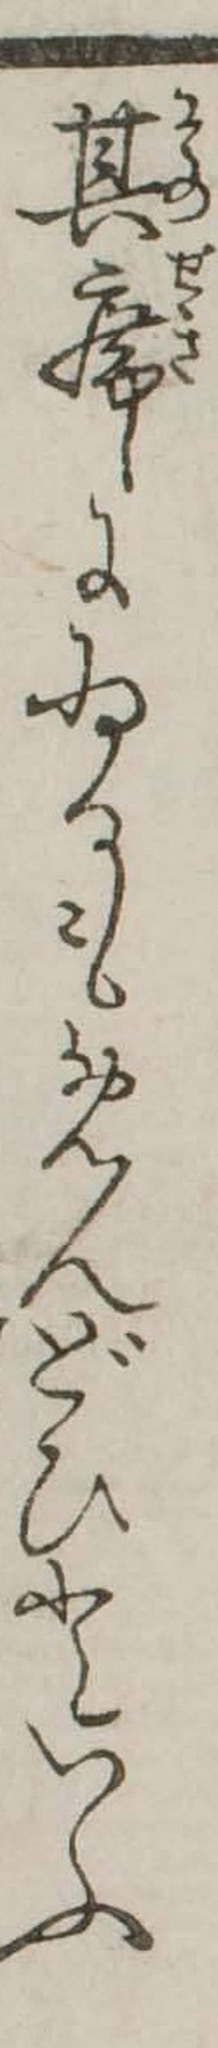其席にゐるもめんどひといふ
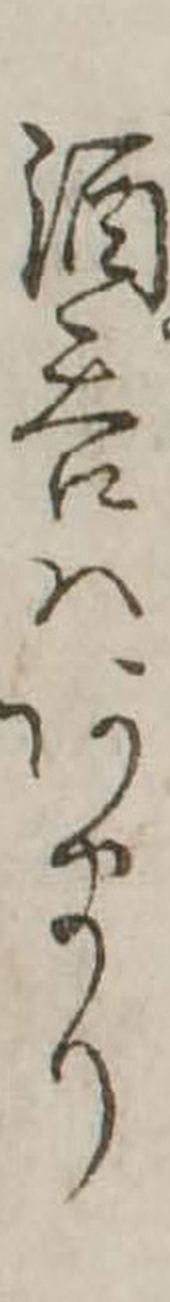酒呑はあまり
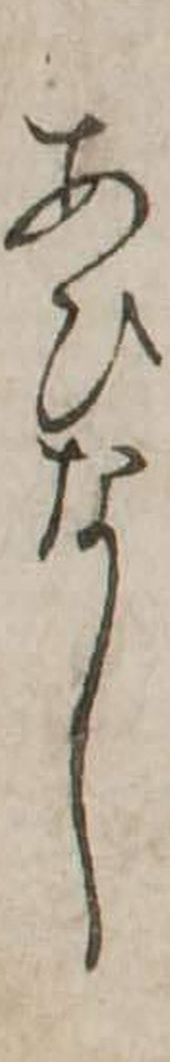あひなし

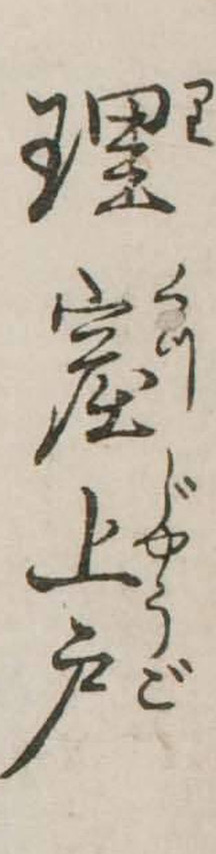理窟上戸
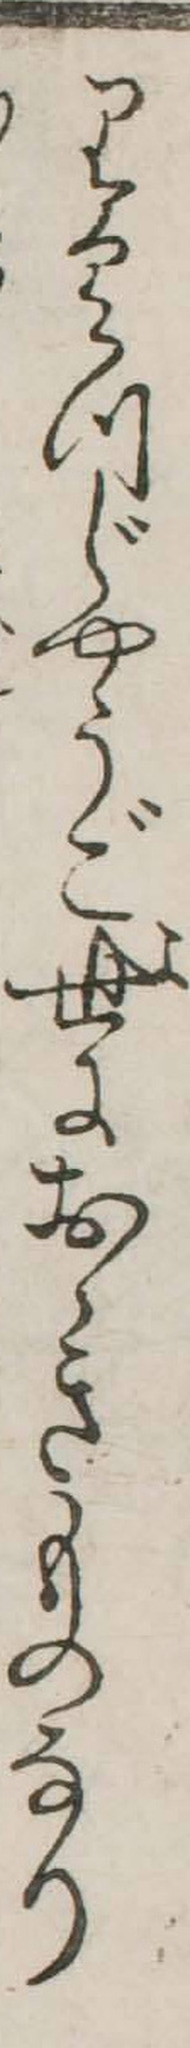りくつじやうご世におゝきものなり
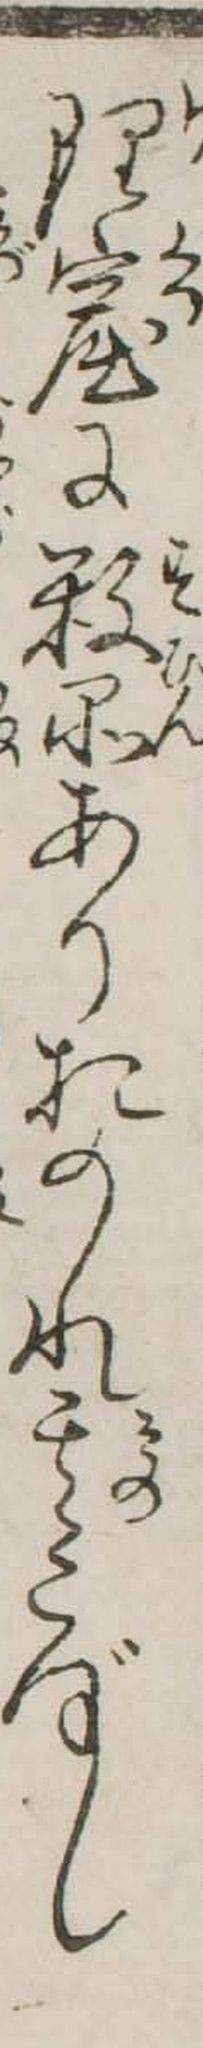理窟に数品ありおのれ其こぼし
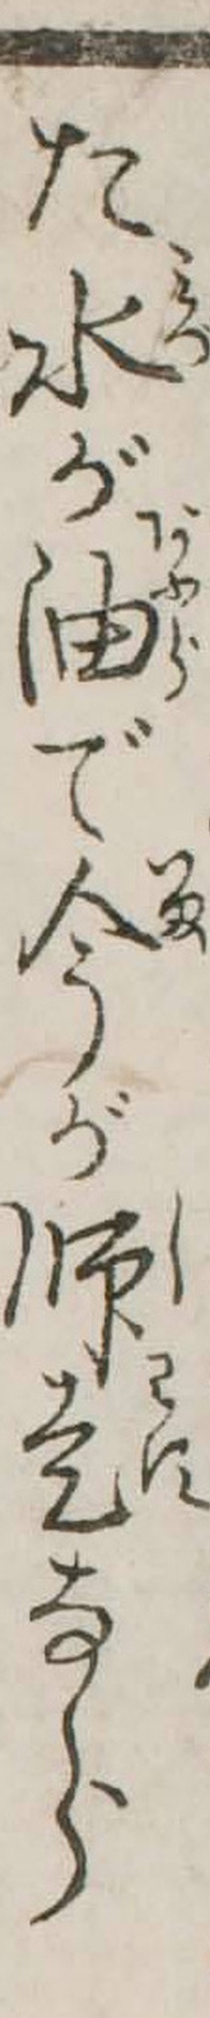た水が油で今が師走なら
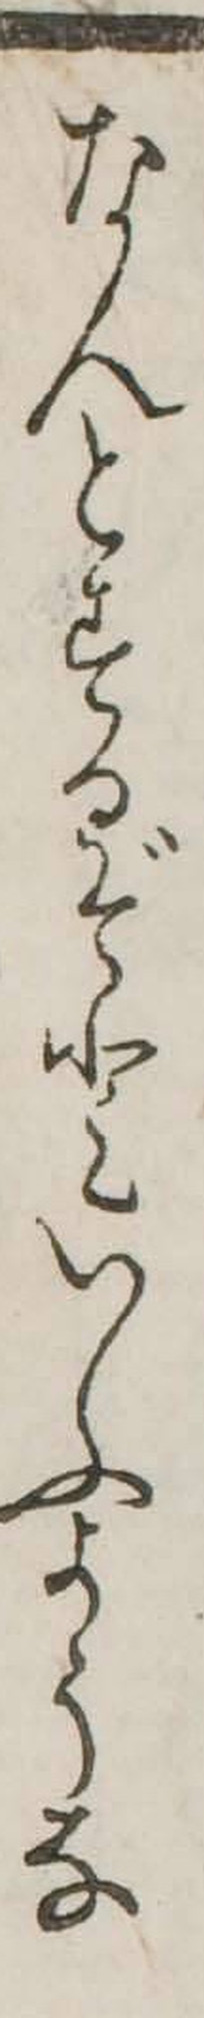なんとするぞといふようような
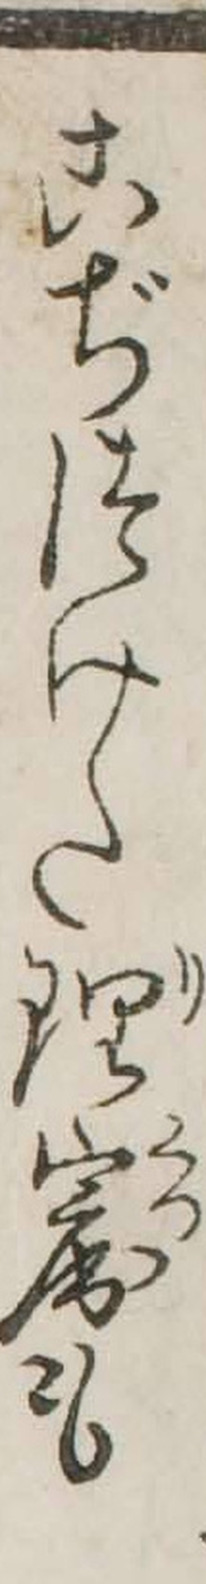こぢつけた理窟も
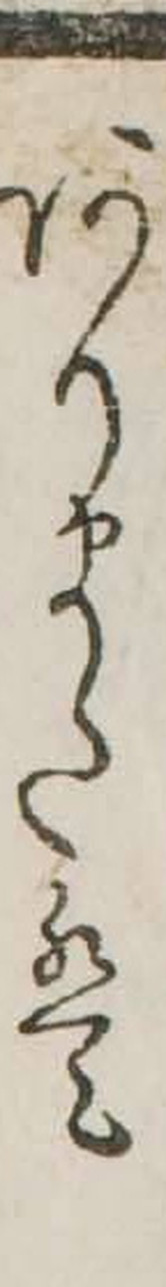ありまたは
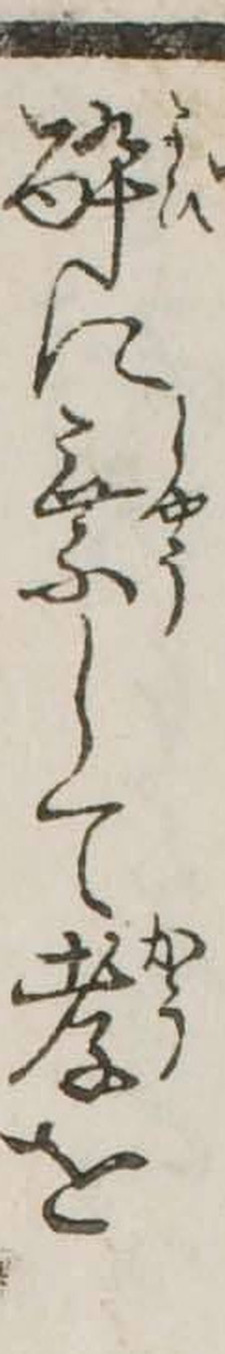酔に乗して孝を
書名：繪本不盡泉
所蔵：国文学研究資料館
